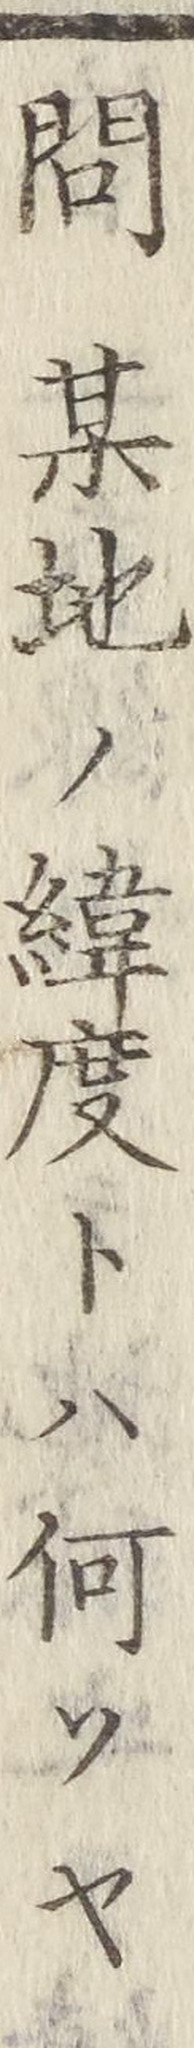問某地ノ緯度トハ何ソヤ
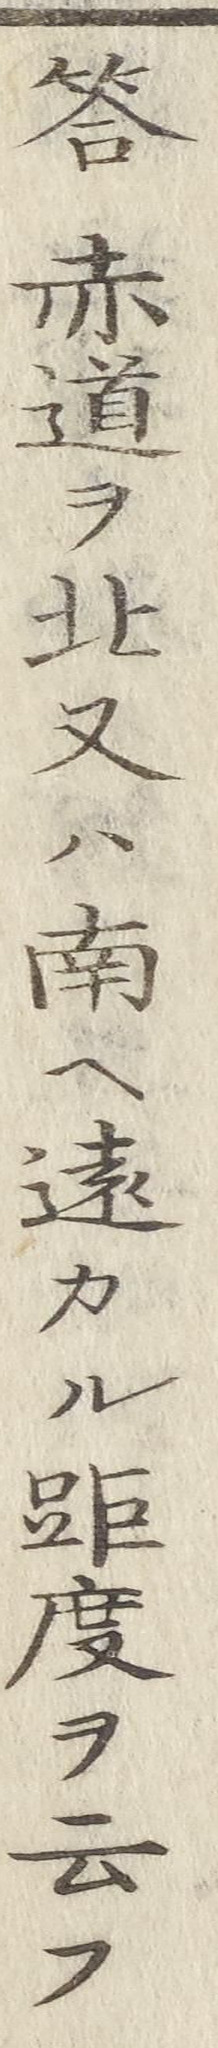答赤道ヲ北又ハ南ヘ遠カル距度ヲ云フ
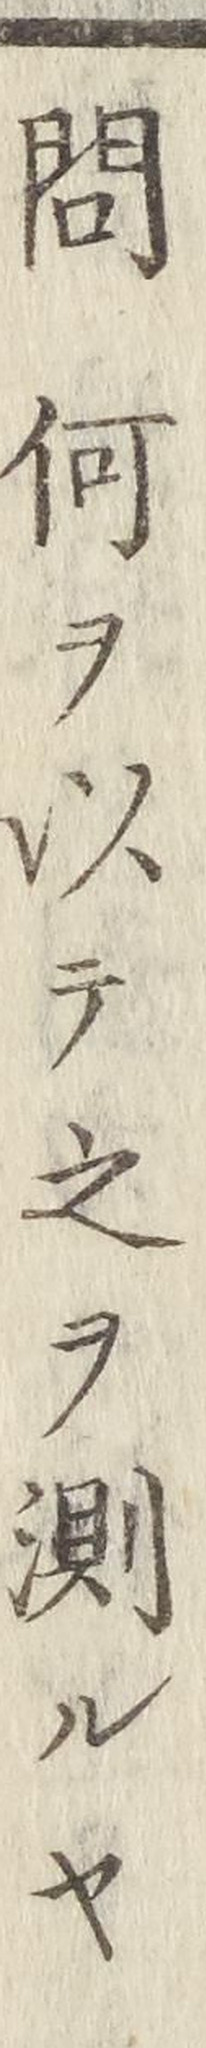問何ヲ以テ之ヲ測ルヤ
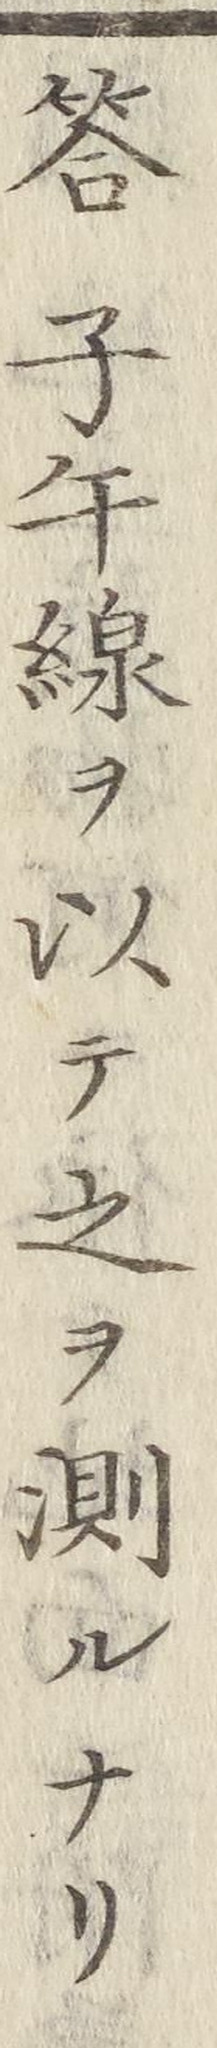答子午線ヲ以テ之ヲ測ルナリ
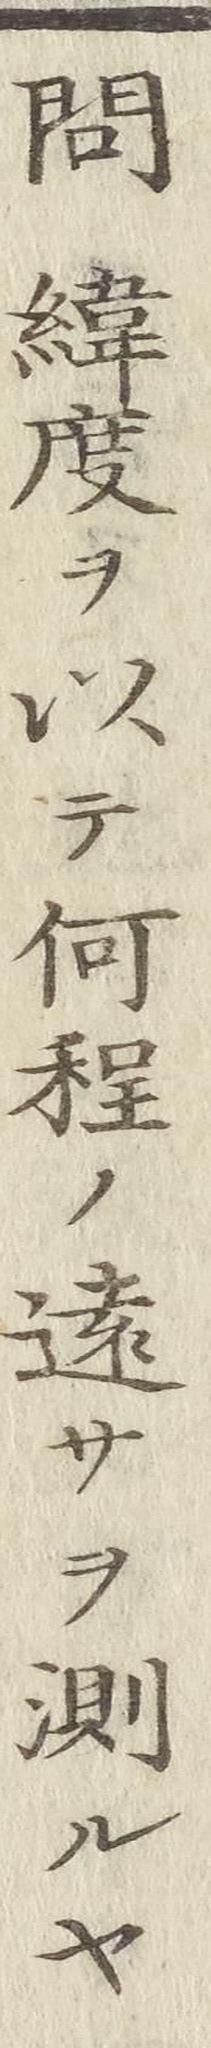問緯度ヲ以テ何程ノ遠サヲ測ルヤ
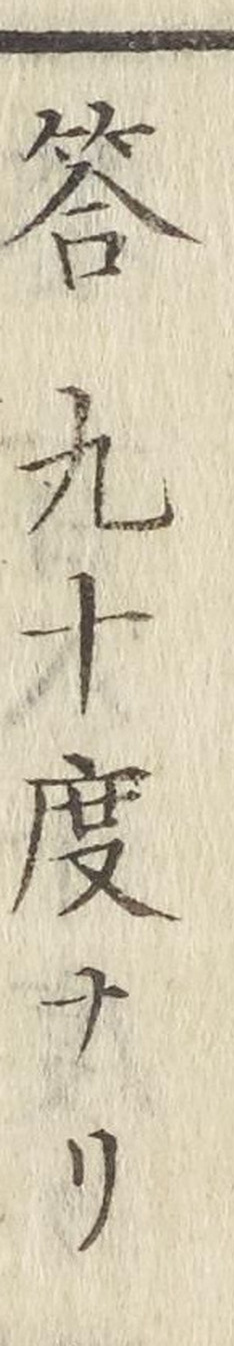答九十度ナリ
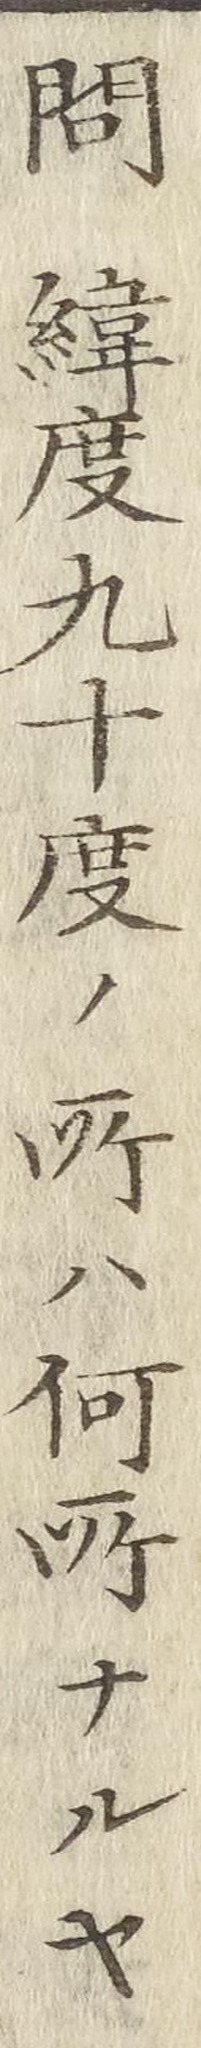問緯度九十度ノ所ハ何所ナルヤ
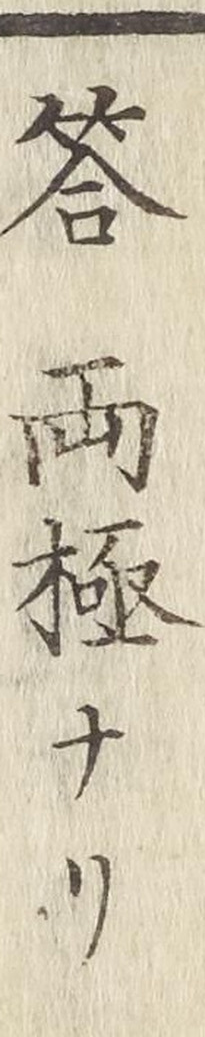答両極ナリ
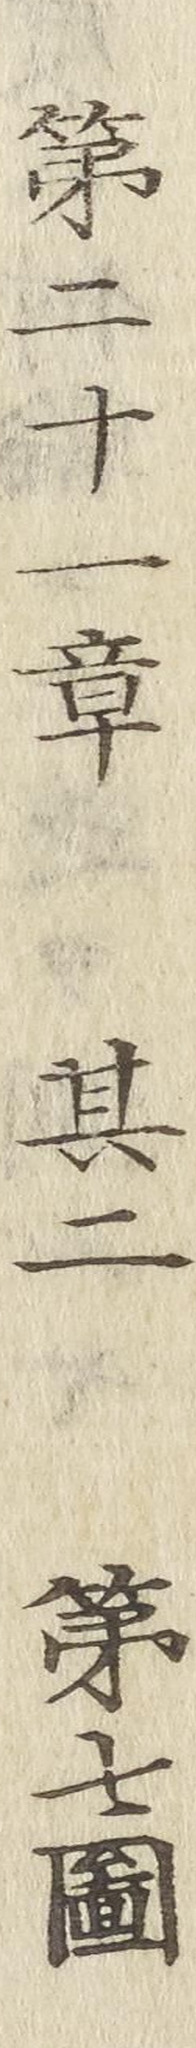第二十一章其二第七図
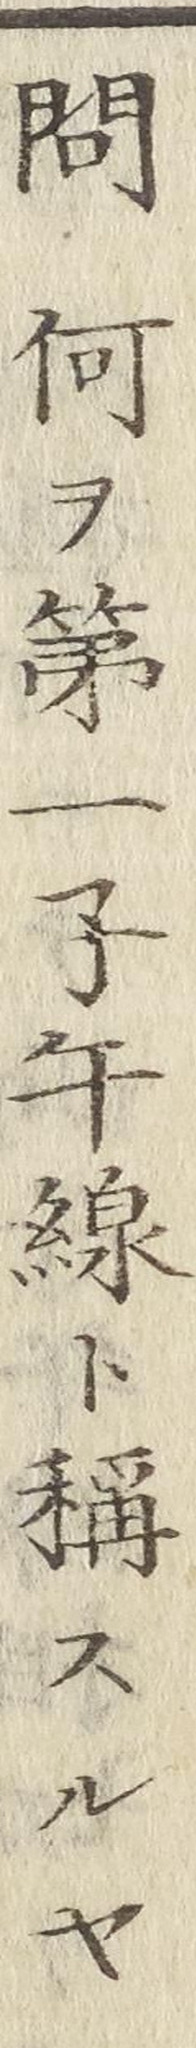問何ヲ第一子午線ト称スルヤ
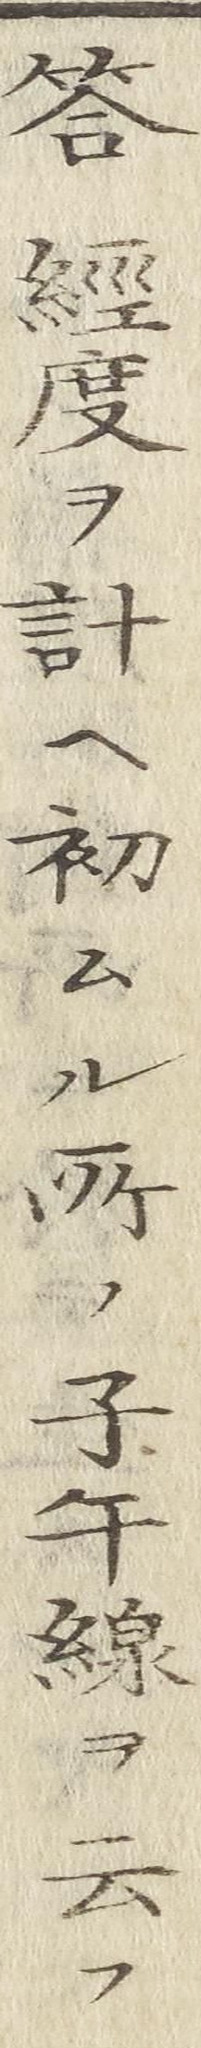答経度ヲ計ヘ初ムル所ノ子午線ヲ云フ
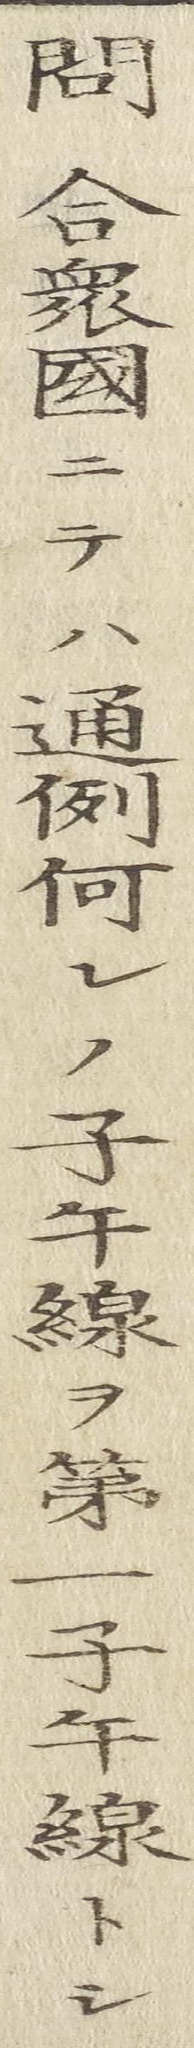問合衆国ニテハ通例何レノ子午線ヲ第一子午線トシ
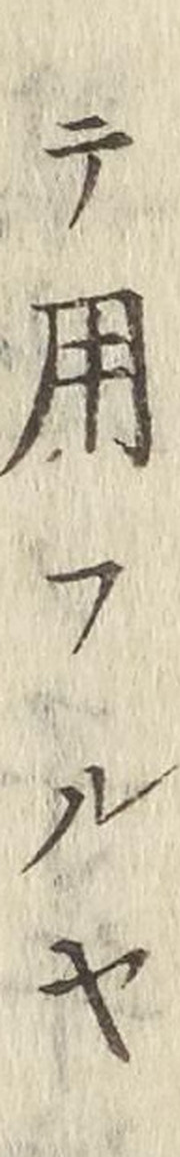テ用フルヤ
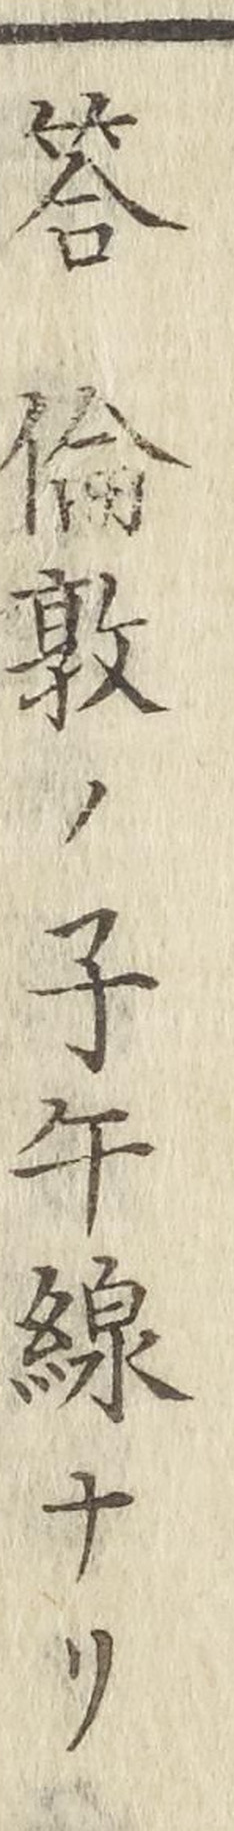答倫敦ノ子午線ナリ
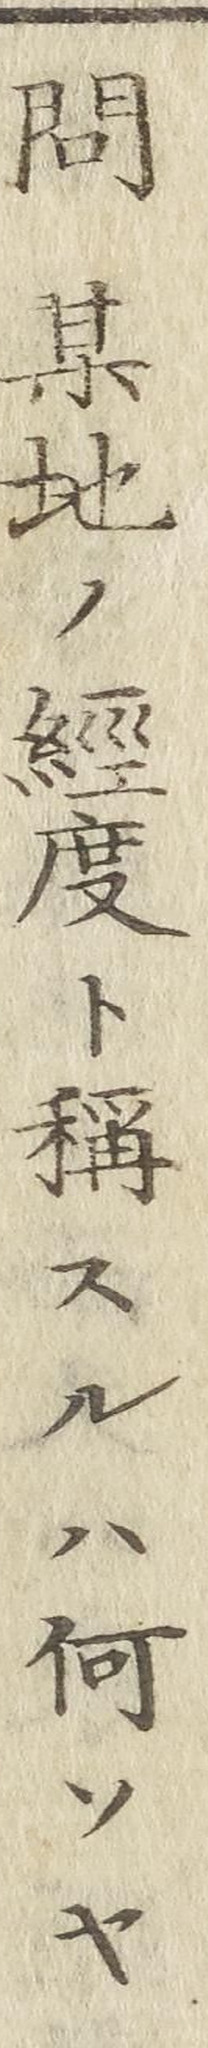問某地ノ経度ト称スルハ何ソヤ

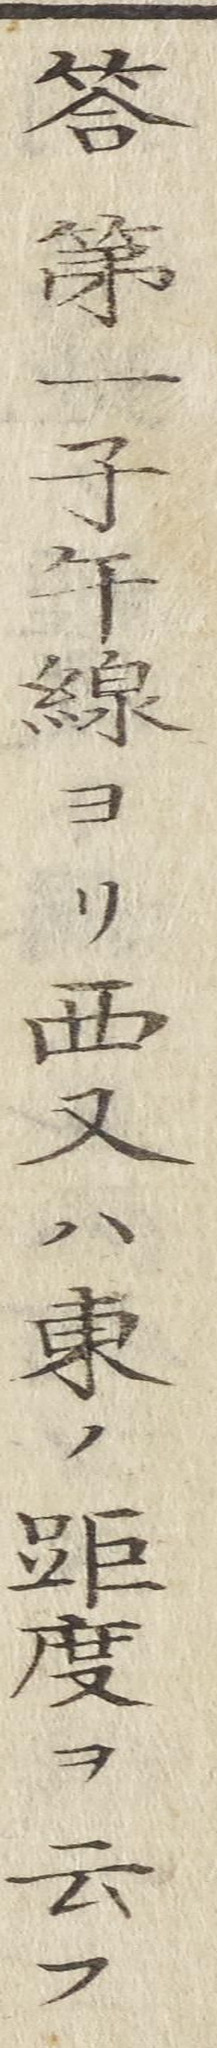答第一子午線ヨリ西又ハ東ノ距度ヲ云フ
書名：星学圖説　上
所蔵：東京大学地震研究所図書室 Earthquake Research Institute Library, The University of Tokyo, JAPAN
